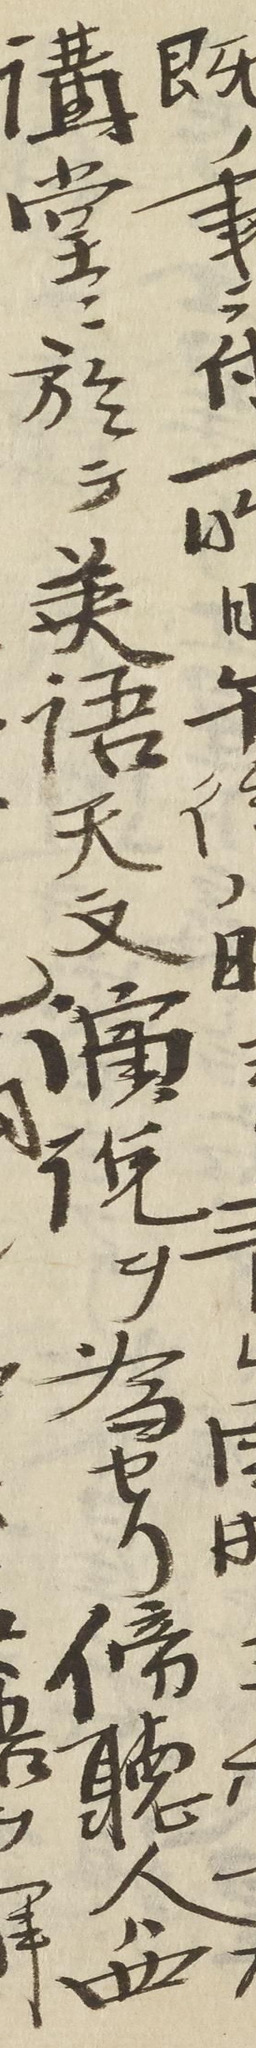講堂ニ於テ英語天文演説ヲ為セリ傍聴人ハ四
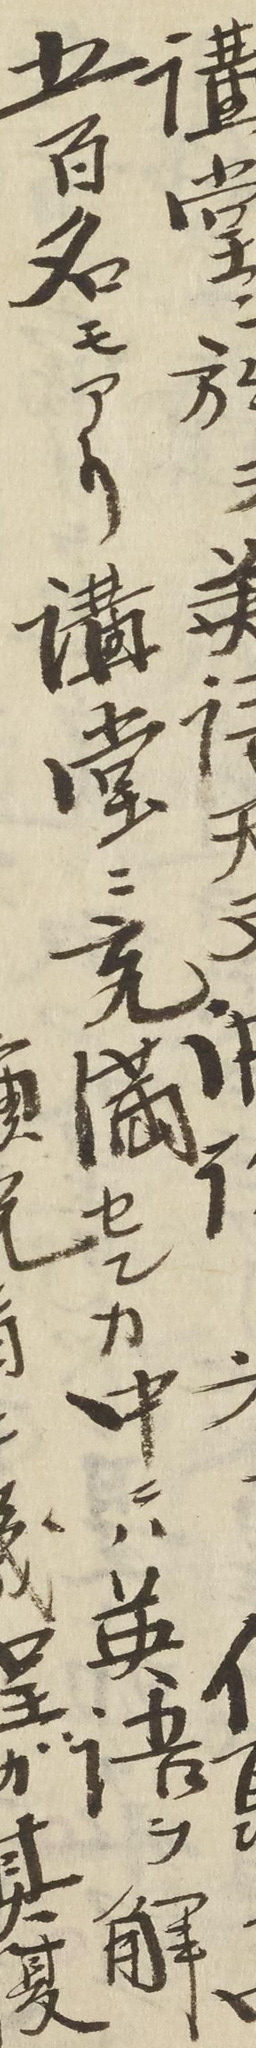五百名モアリ講堂ニ充満セルガ中ニハ英語ヲ解
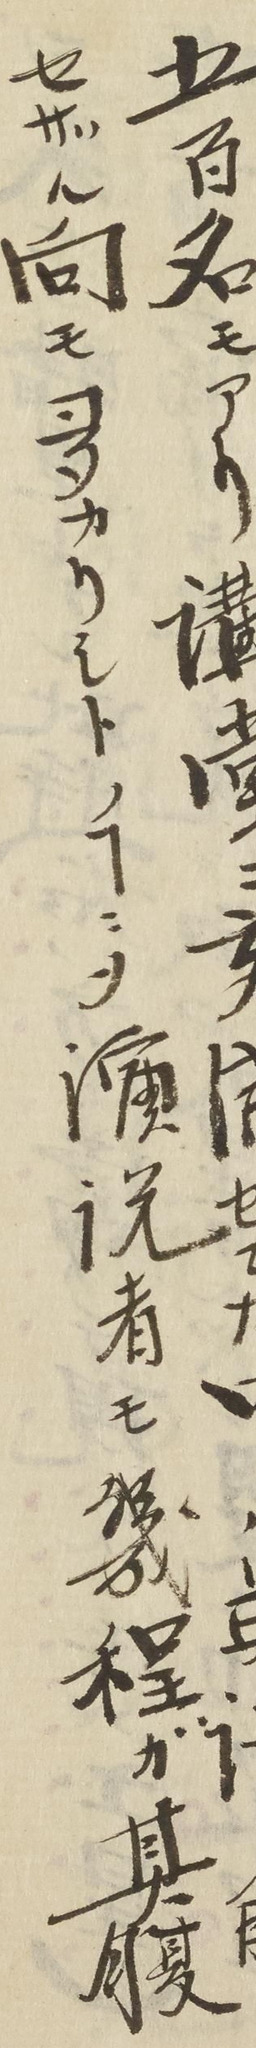セザル向モ多カリシトノコトニシテ演説者モ幾程ガ其腹
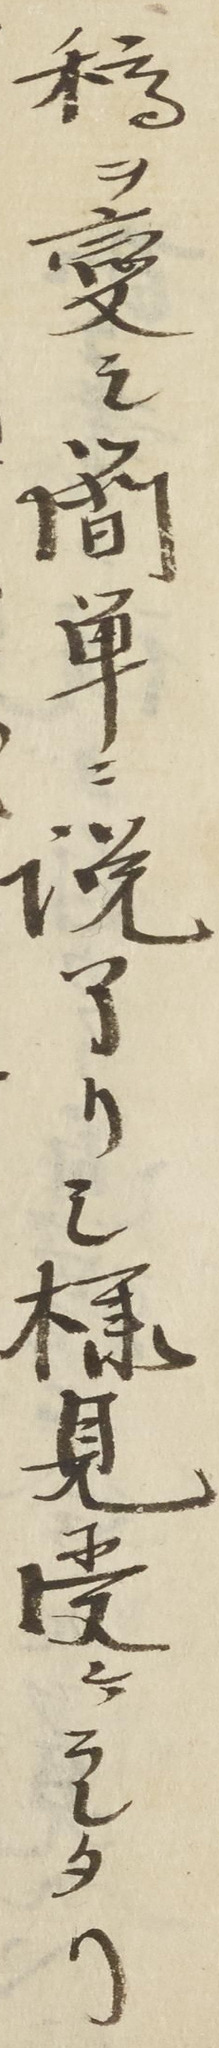稿ヲ変シ簡単ニ説了リシ様見受ヶラレタリ
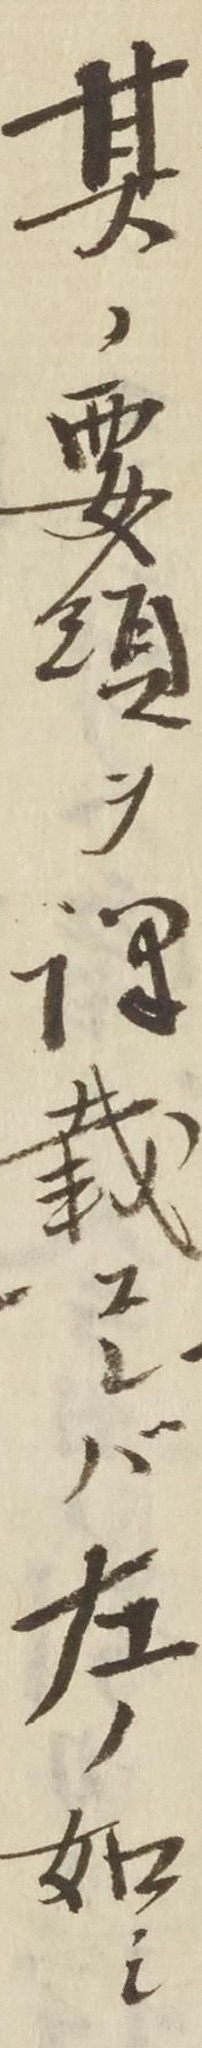其ノ要領ヲ課載スレバ左ノ如シ
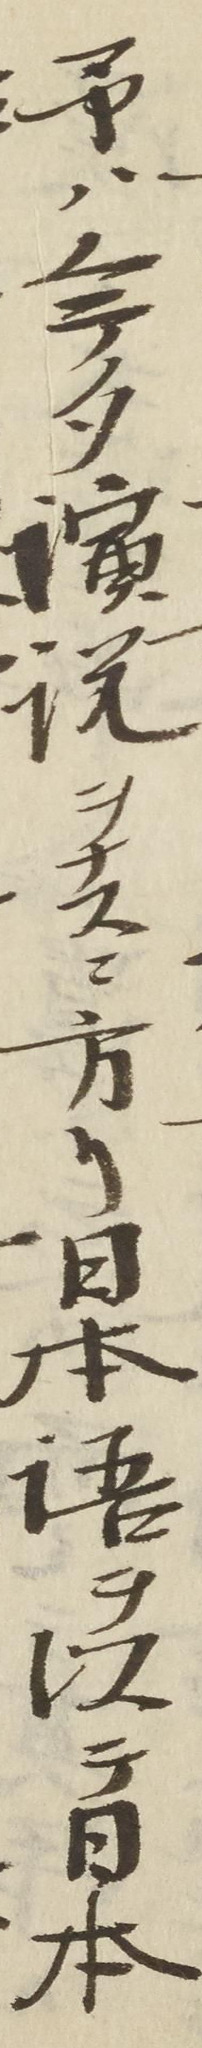予ハ今夕演説ヲナスニ方リ日本語ヲ以テ日本
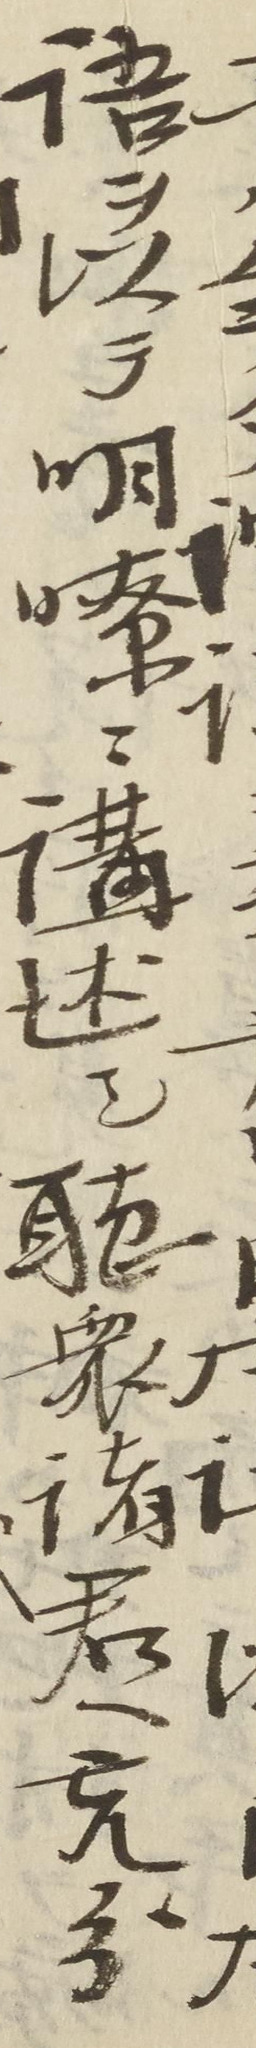語ヲ以テ明瞭ニ講述シ聴衆諸君ヘ充分
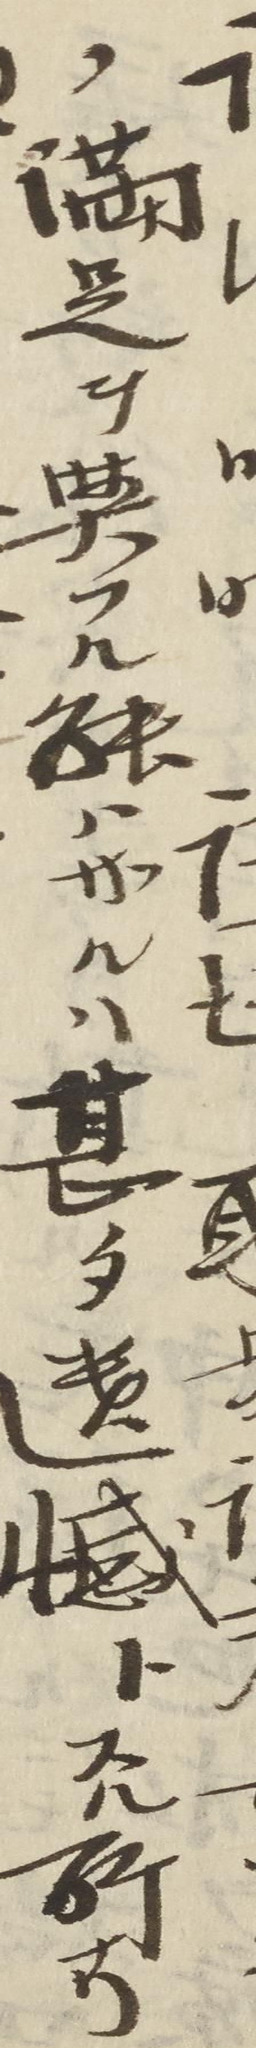ノ満足ヲ与フル能ハザルハ甚タ遺憾トスル所ナリ
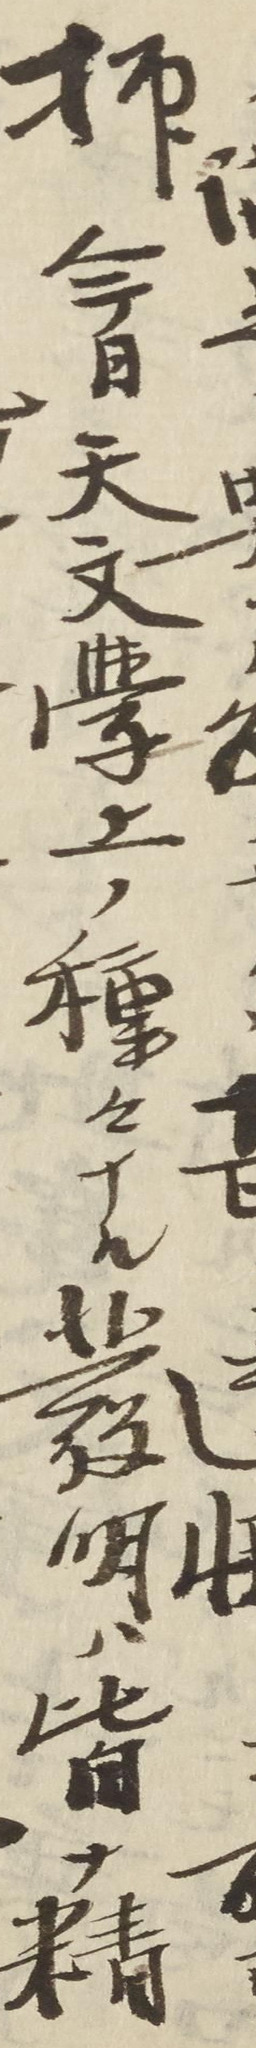抑今日天文学上ノ種々ナル発明ハ皆ナ精
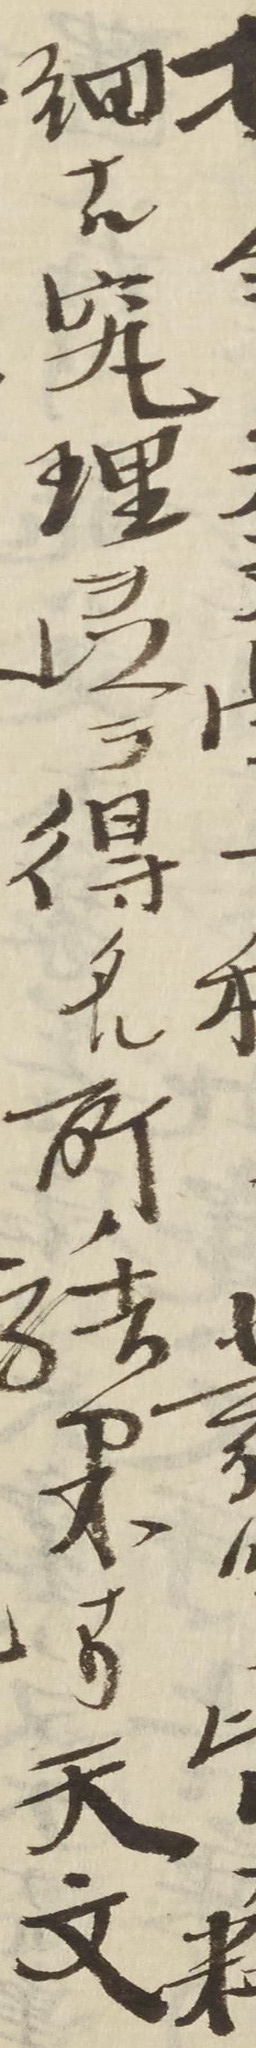細ナル究理ヲ以テ得タル所ノ結果ナリ天文
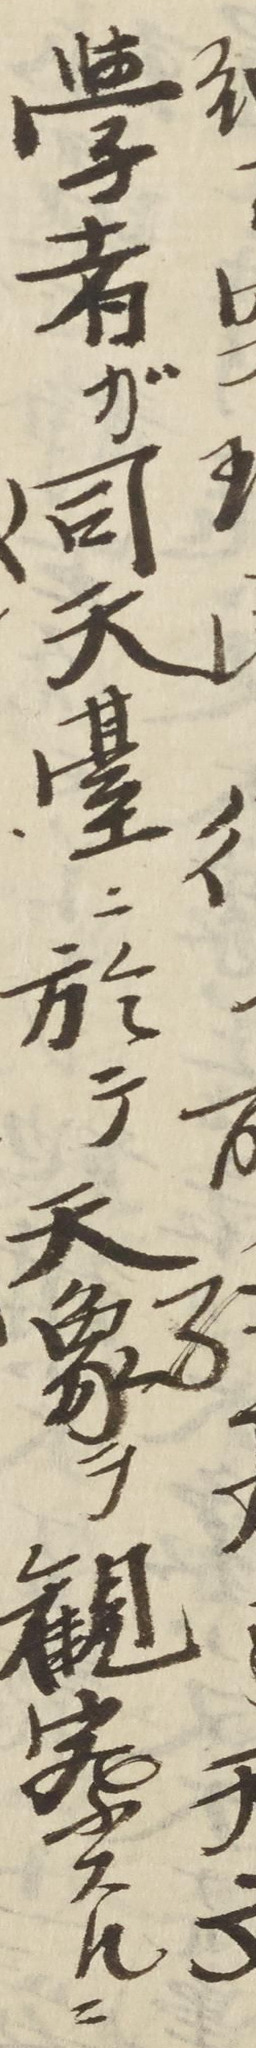学者ガ司天台ニ於テ天象ヲ観察スルニ
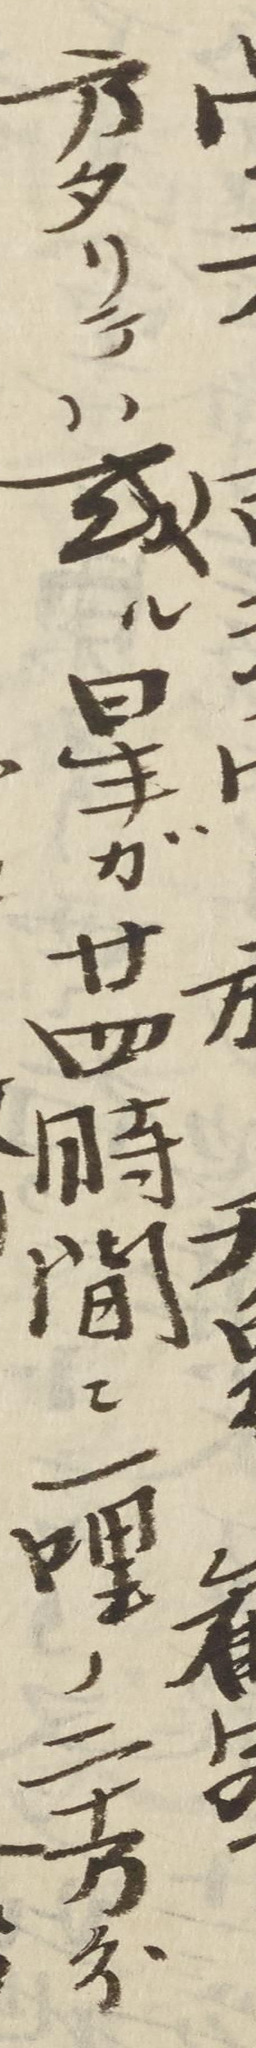方タリテハ或ル星ガ廿四時間ニ一哩ノ二十万分
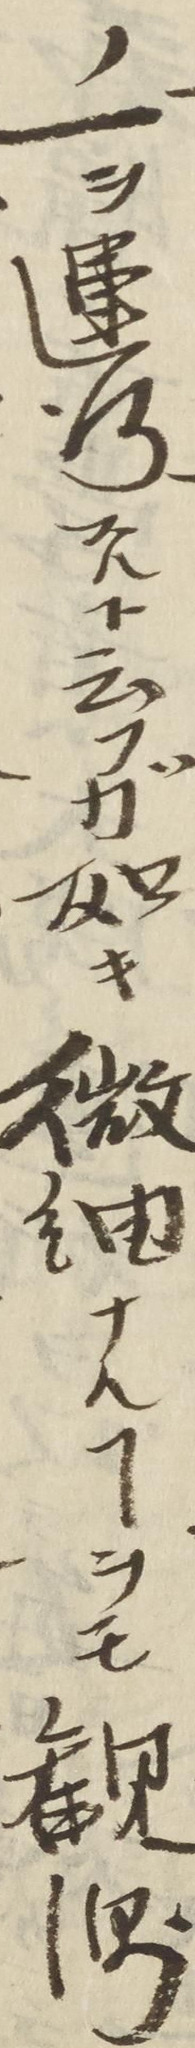ノ一ヲ運行スルト云フガ如キ微細ナルコトヲモ観測
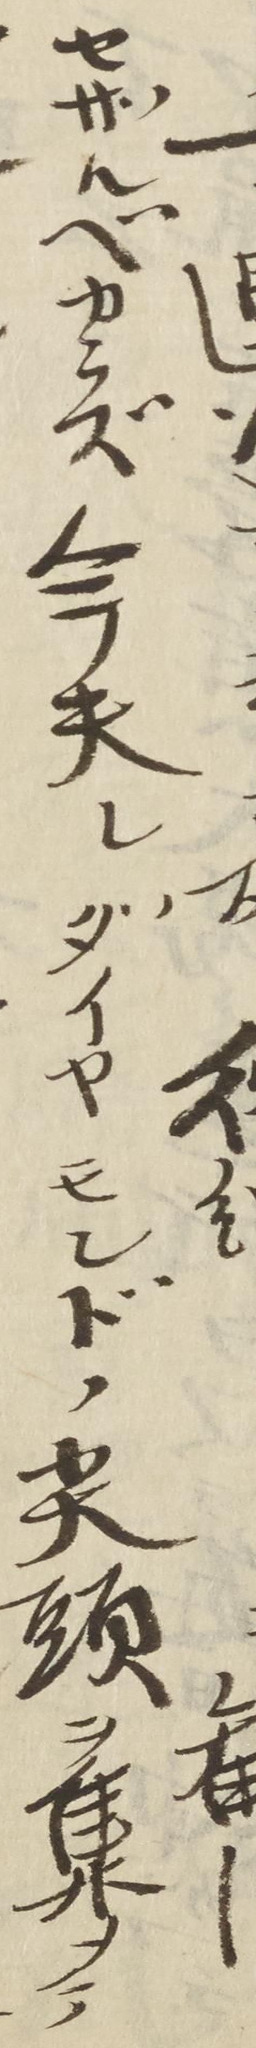セザルベカラズ今夫レダイヤモンドノ尖頭ヲ集メテ
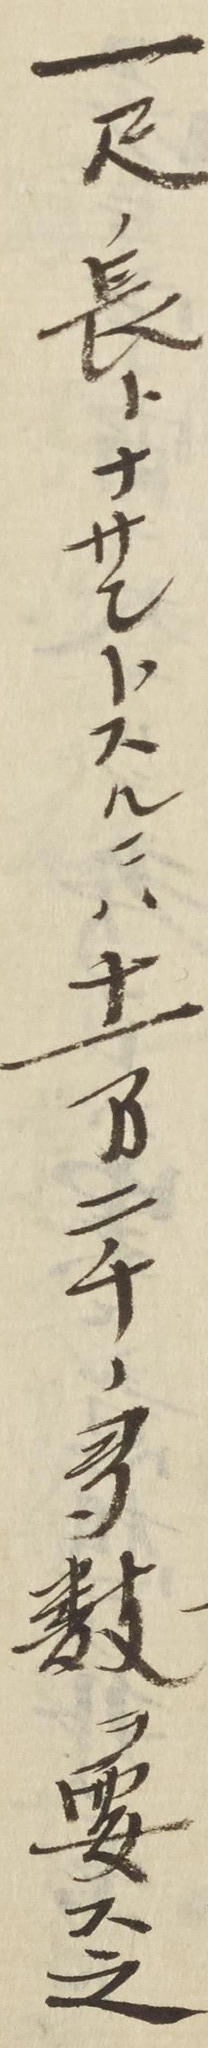一尺ノ長トナサントスルニハ十一万二千ノ多数ヲ要ス之

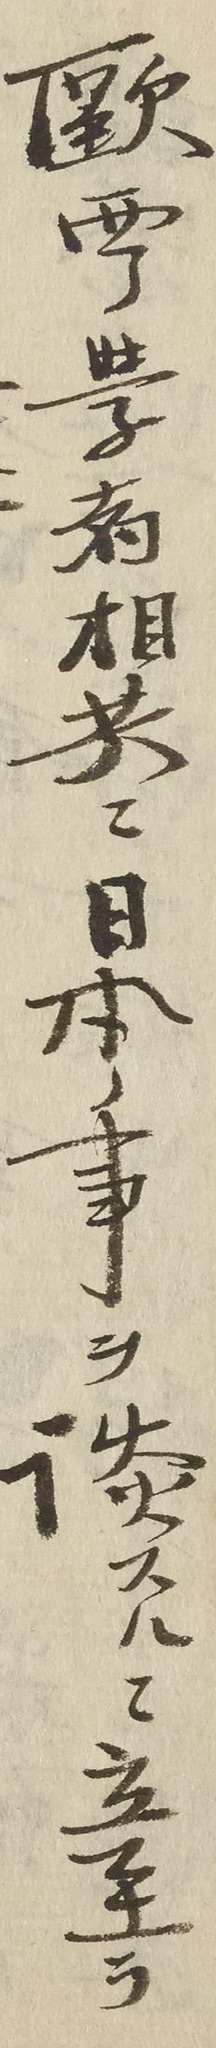欧西ノ学者相共二日本ノ事ヲ談スル二立至ラ
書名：日蝕録　全
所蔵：東京大学地震研究所図書室 Earthquake Research Institute Library, The University of Tokyo, JAPAN
